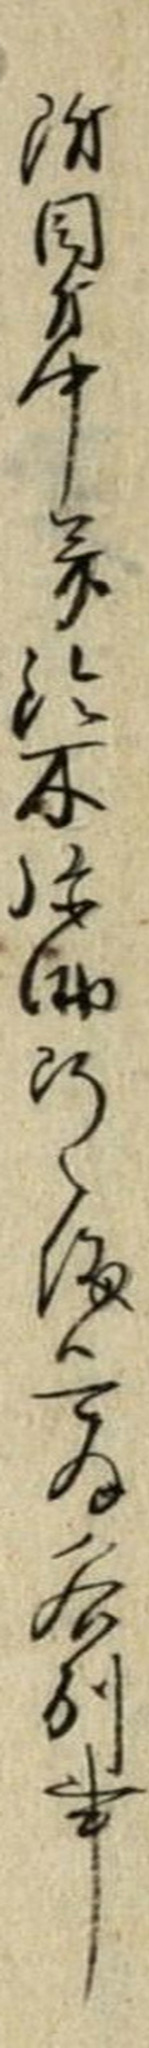附御目付中幷鈴木弥助断之儀は可為各別事
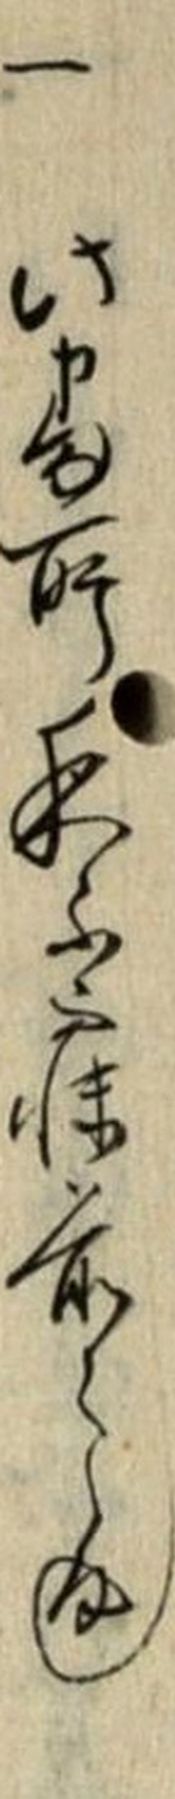一此番所夜不寝前々之通
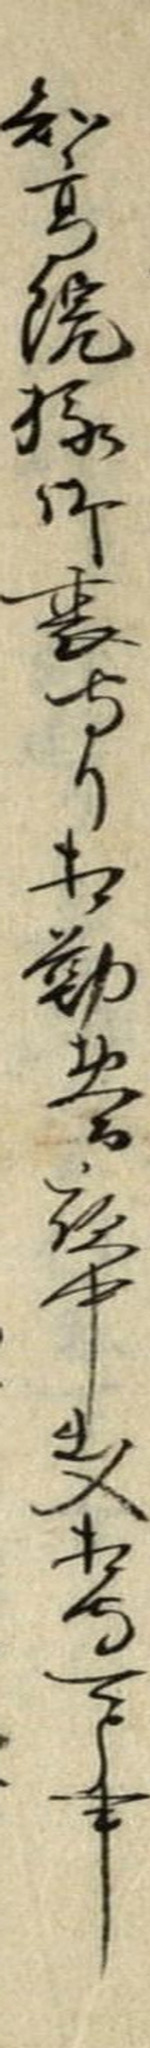知高院様御裏守り相勤惣て夜中出入相守可申事
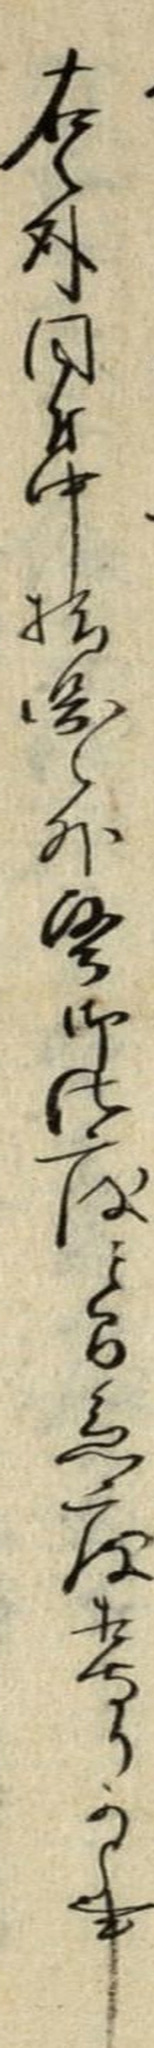右之外目付中指図之外堅御法度に候間急度相守り可申事
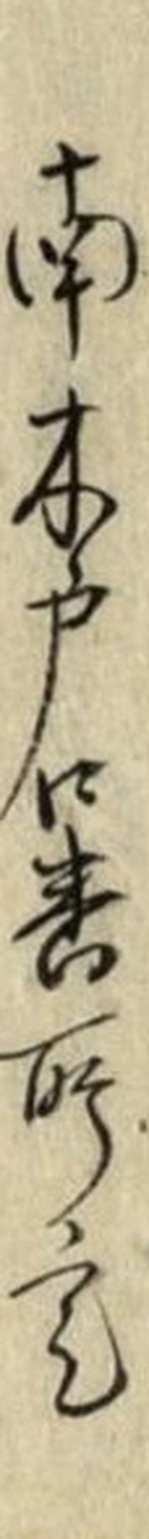南木戸口番所定
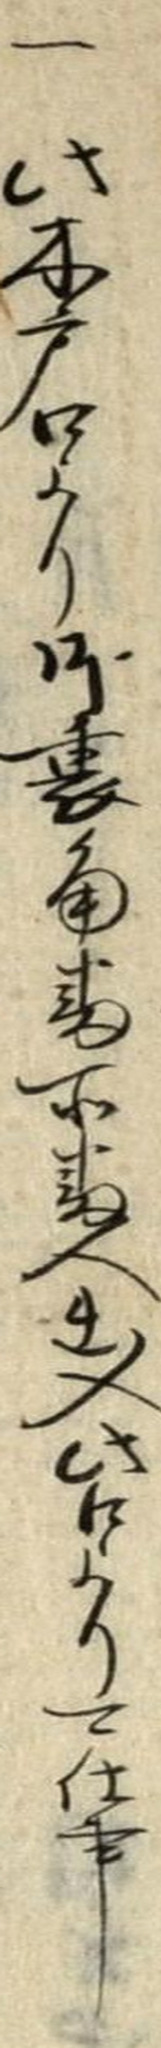一此木戸口より御裏角番所番人出入此口より可仕事
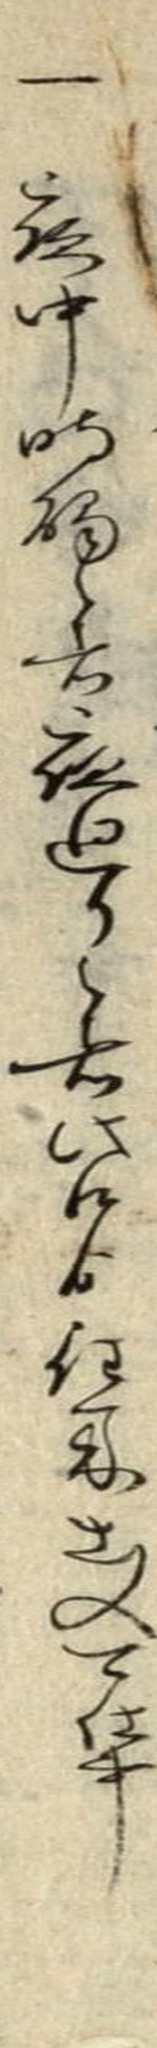一夜中時触之者夜廻之者此口より往来出入可仕事
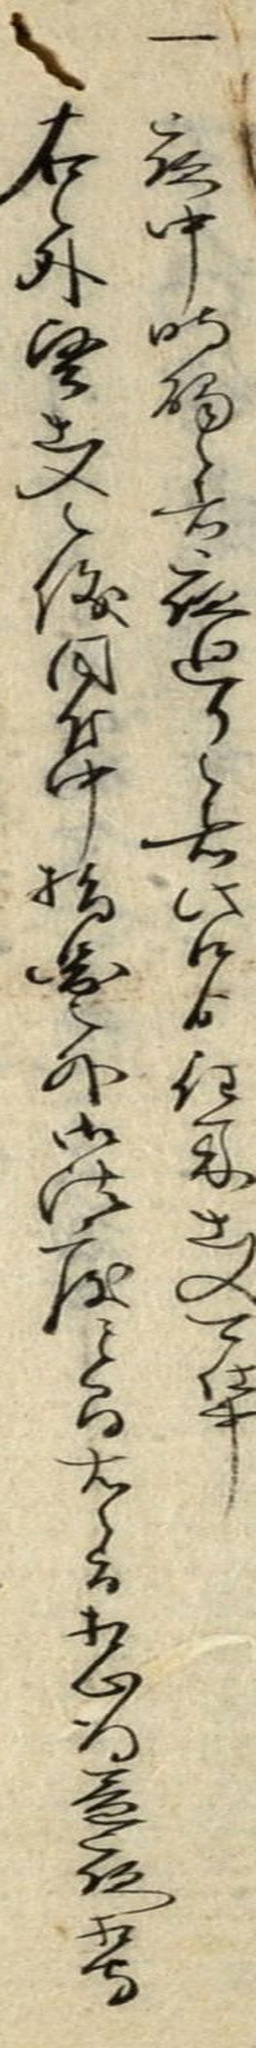右之外堅出入之儀目付中指図之外御法度に候間右之旨相心得昼夜相守
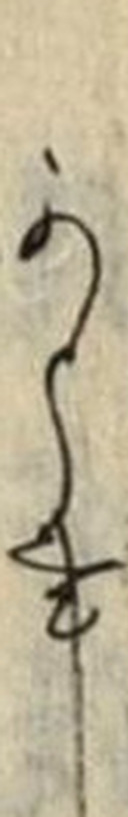可申事
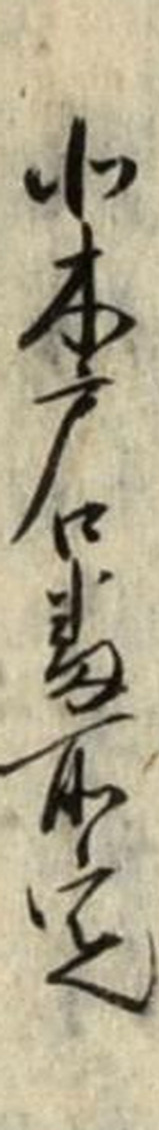北木戸口番所定
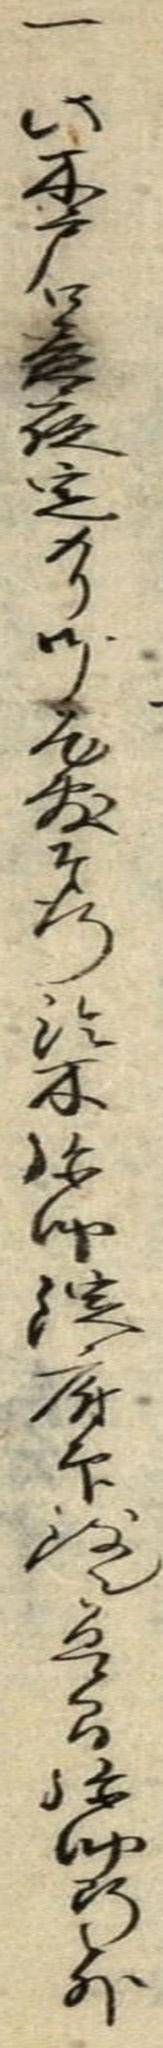一此木戸口昼夜定〆り御屋敷奉行鈴木弥助錠府印致し置候間弥助断之外
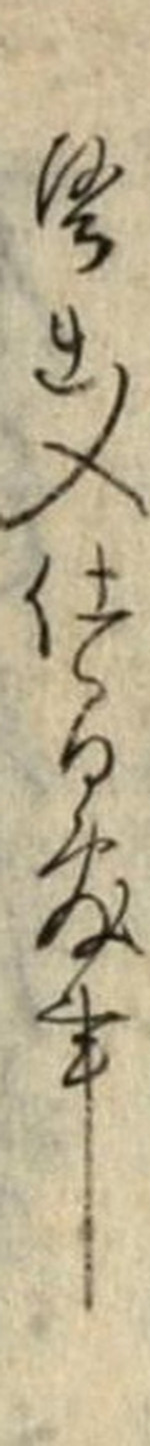堅出入仕間敷事

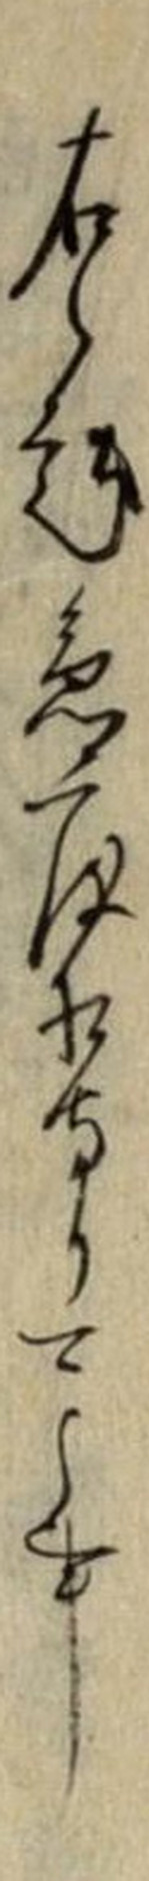右之趣急度相守り可申事
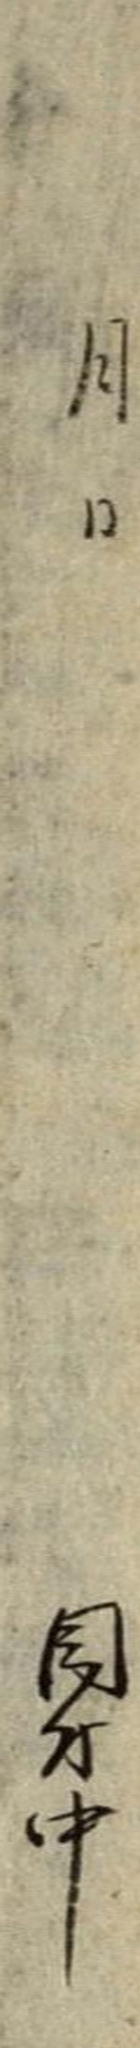月日目付中
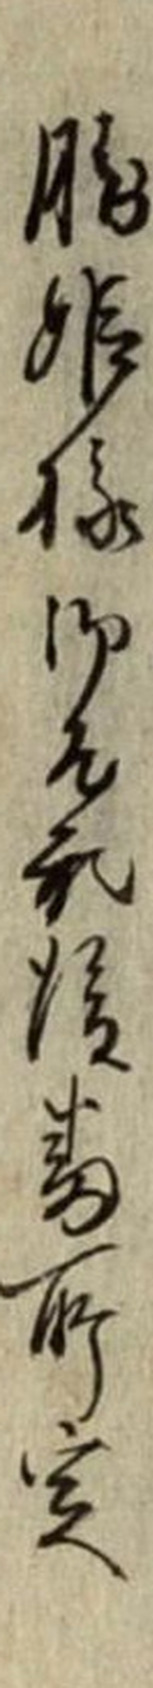勝姫様御屋形後番所定
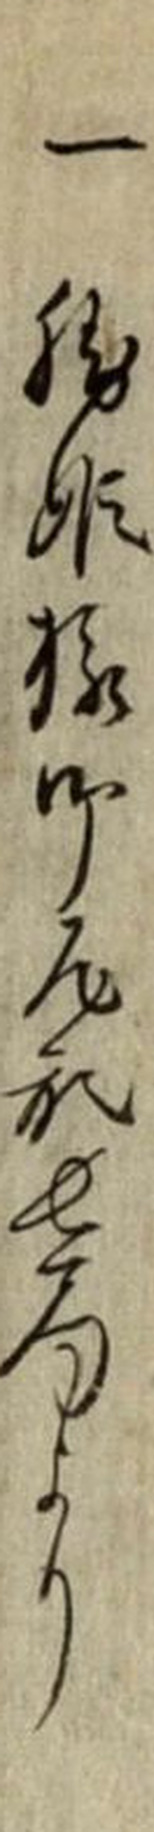一勝姫様御屋形長局より
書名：三都并道中之部
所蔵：福井県文書館 Fukui Prefectural Archives
